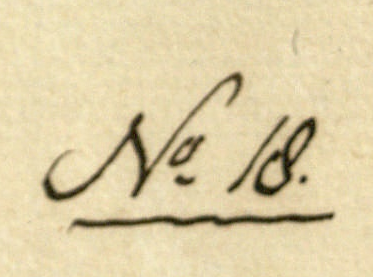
No 18.
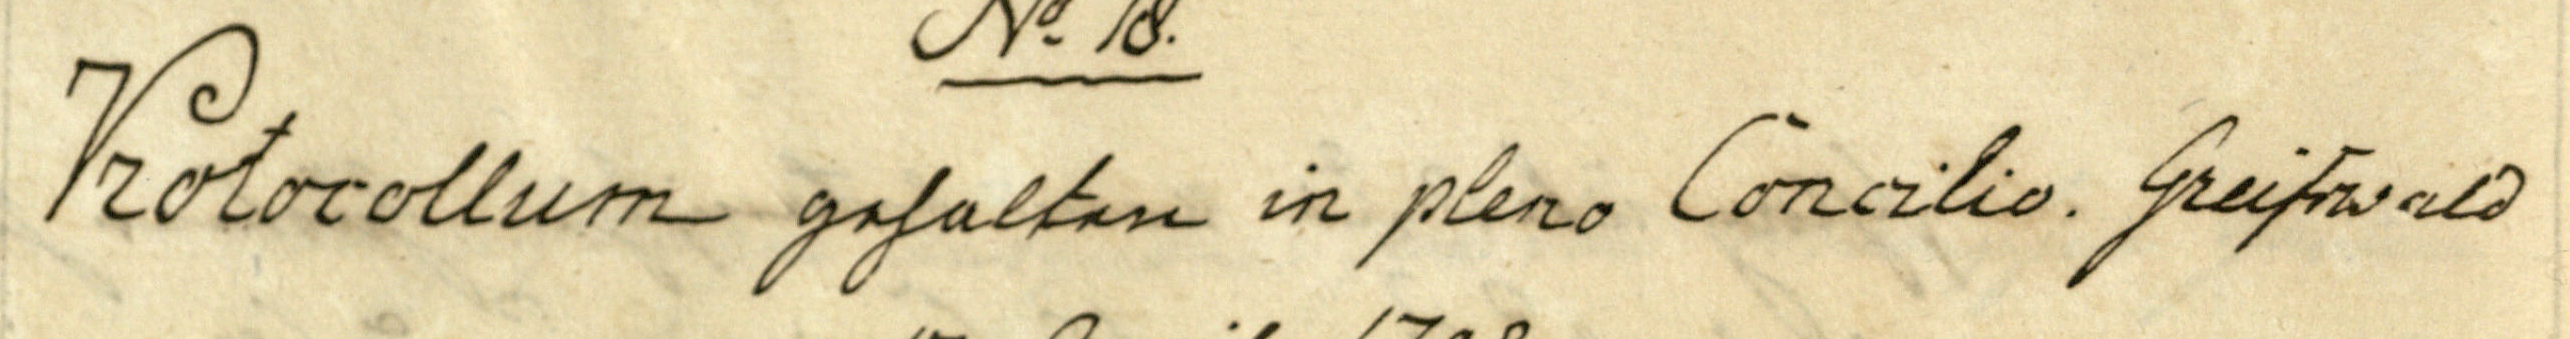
Protocollum gehalten in pleno Concilio Greifswald
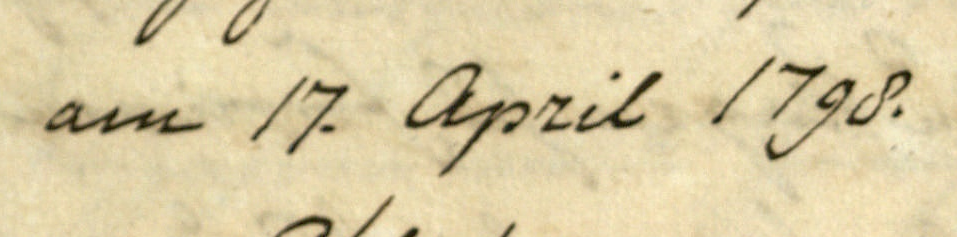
am 17. April 1798.
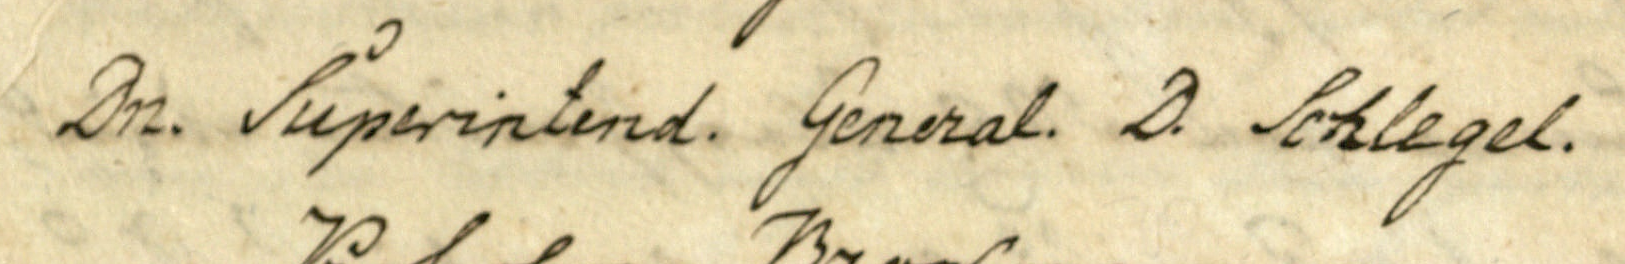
Dn. Superintend. General. D. Schlegel.
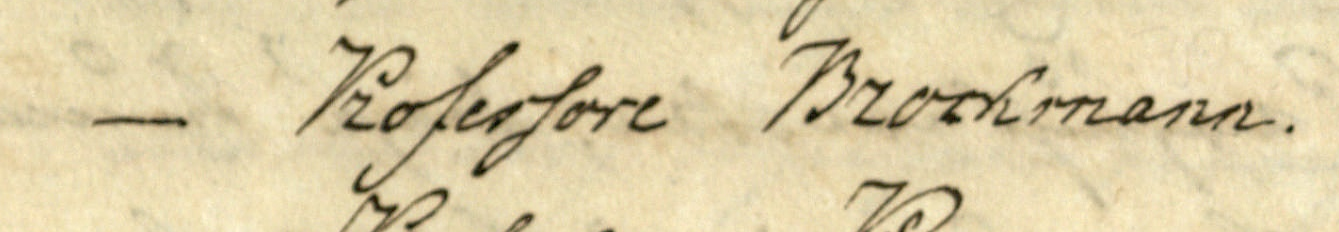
Professore Brockmann.
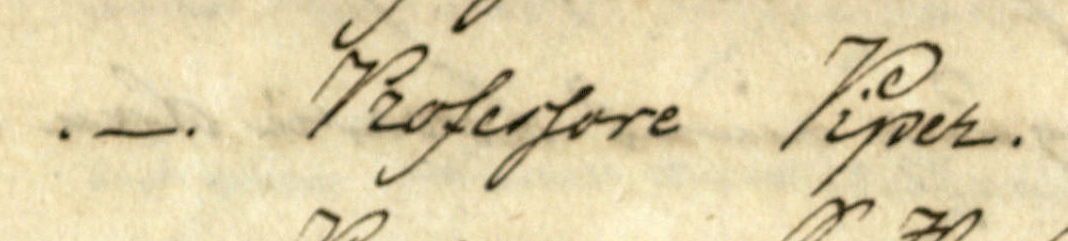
Professore Piper.
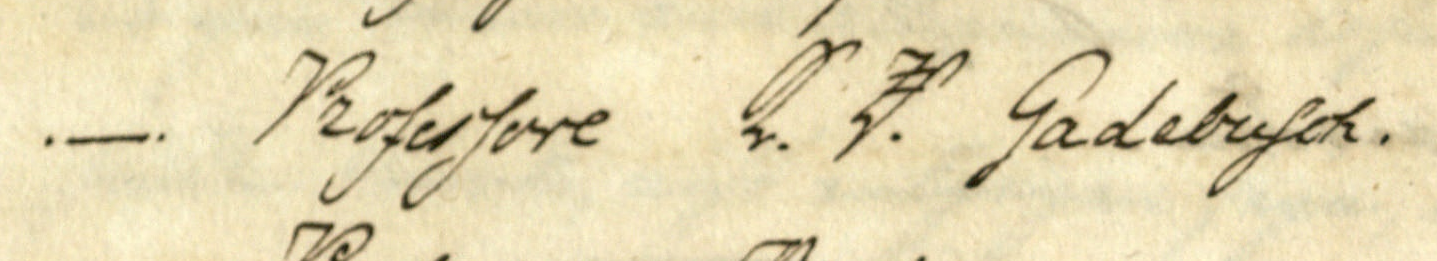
Professore K. R. Gadebusch.
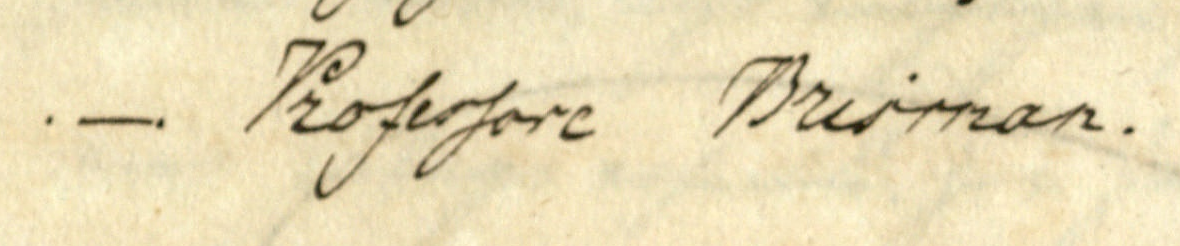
Professore Brisman.
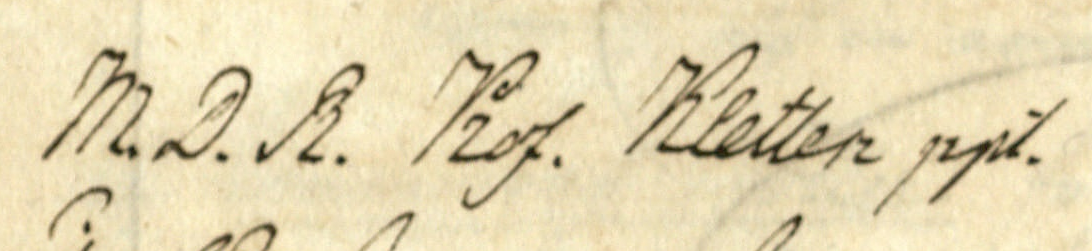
M. D. R. Prof. Kletten ppt.
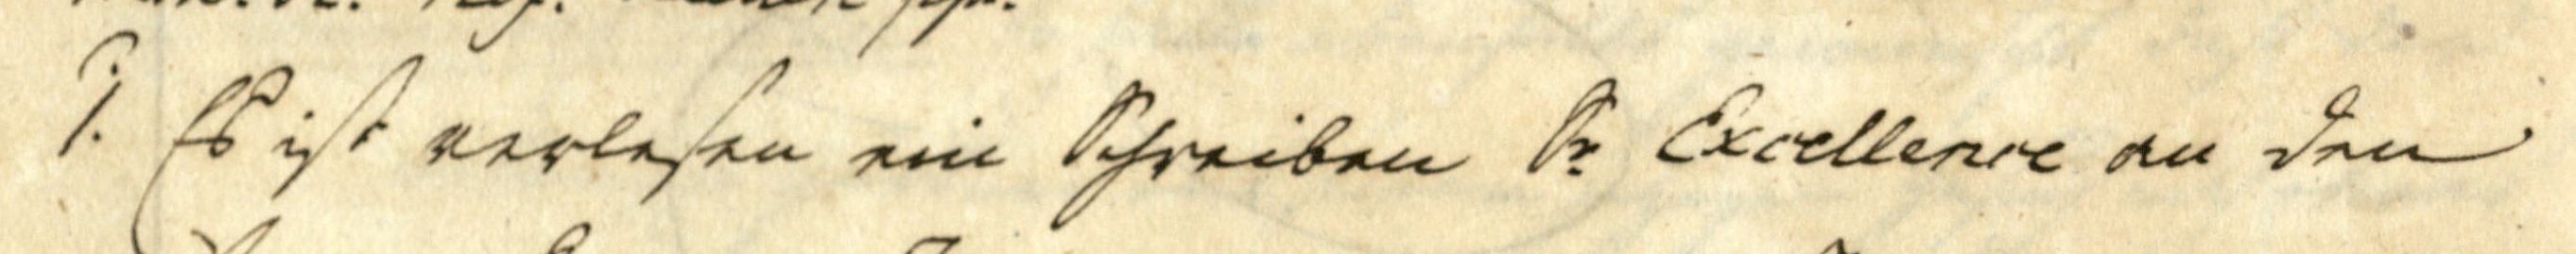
1. Es ist verlesen ein Schreiben Sr Excellence an den
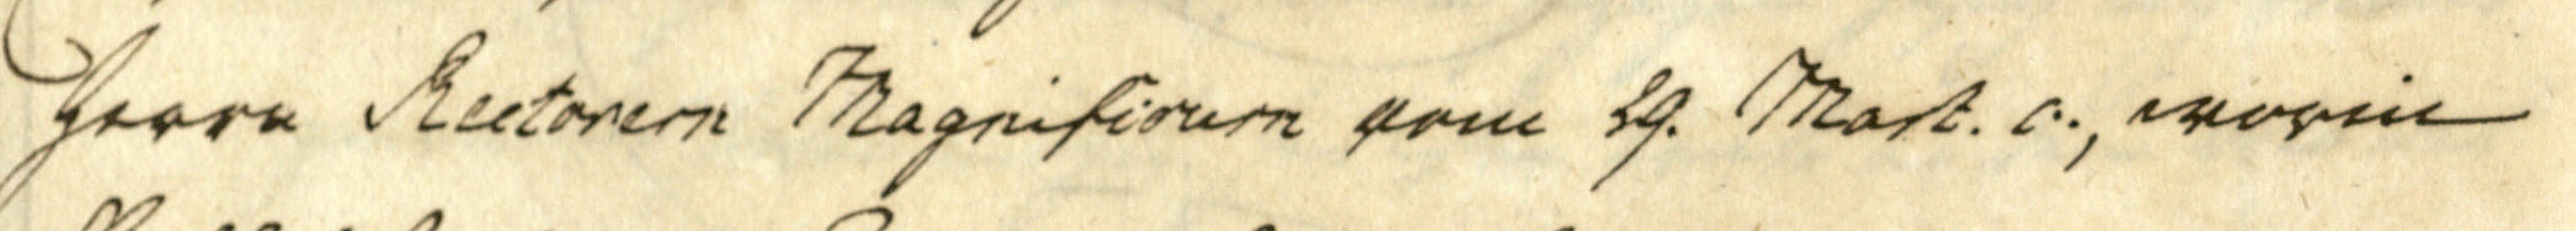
Herrn Rectorem Magnificum vom 29. Mart. c., worin
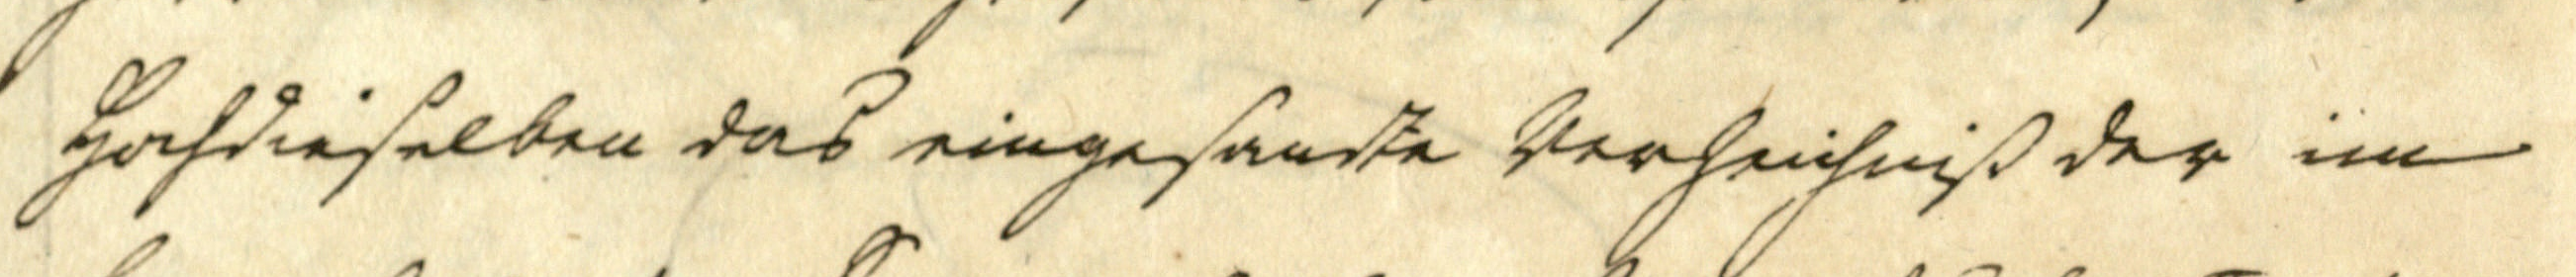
Hochdieselben das eingesandte Verzeichnis der im
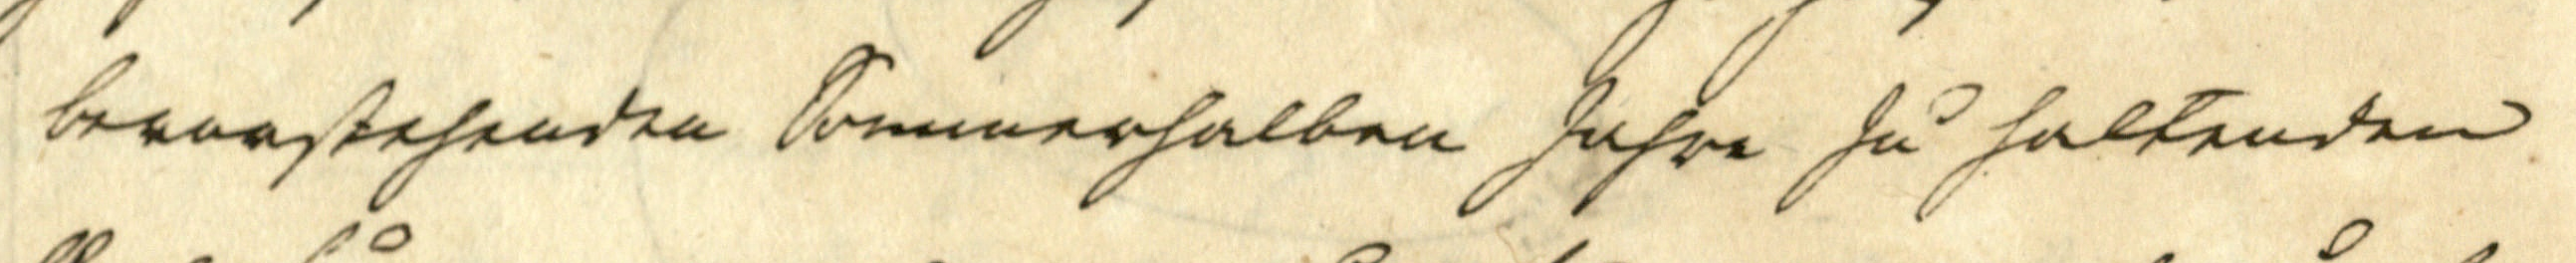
bevorstehenden Sommerhalben Jahre zu haltenden
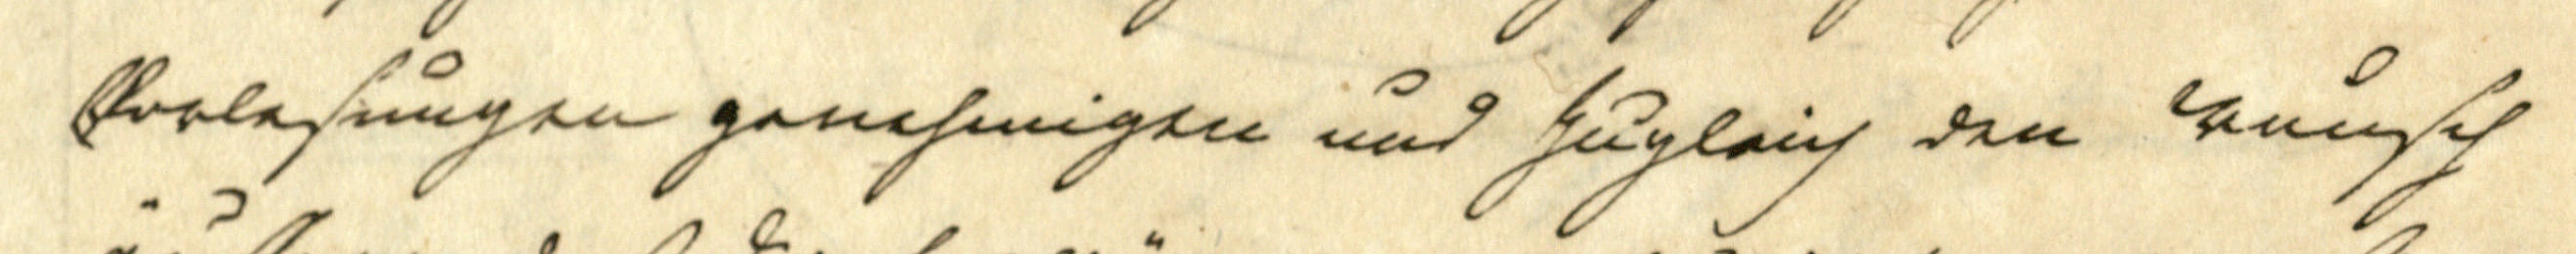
Vorlesungen genehmigen und zugleich den Wunsch
